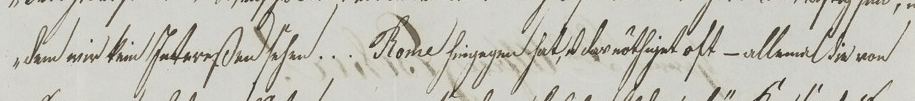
kein Interreßen sehen... Rome hingegen hat, u das nöthiget oft –
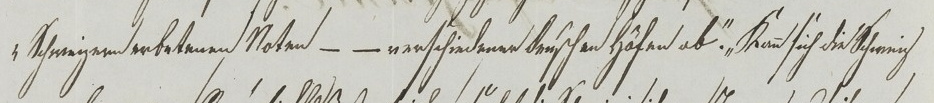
Schweizern erbetenen Noten – – verschiedener deuschen Höfen ab.» «Kann sich die
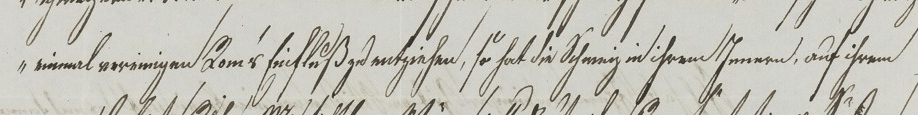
vereinigen Rom's Einfluß zu entziehen, so hat die Schweiz in ihrem Innern,
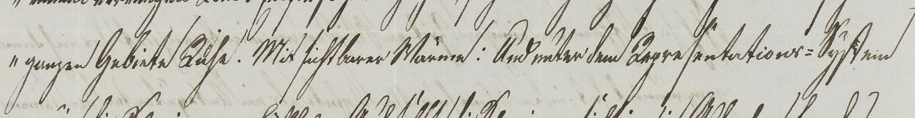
ganzen Gebiete Ruhe. Mit sichtbarer Wärme: Und unter dem Representations-System
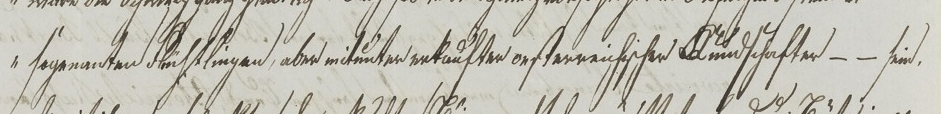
aber mitunter erkaufter oesterreichischer Kundschafter – –
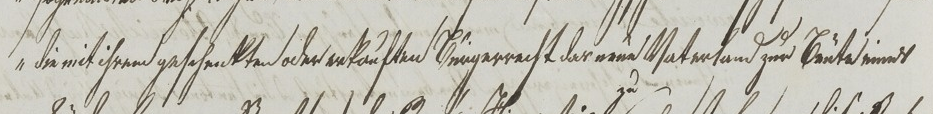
die mit ihrem geschenkten oder erkauften Bürgerrecht das neue Vaterland
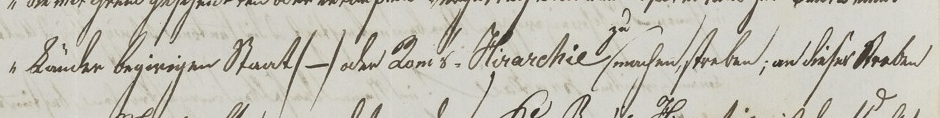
Länder begirigen Staat (–) oder Rom's-Hirarchie zu machen streben; an dieses
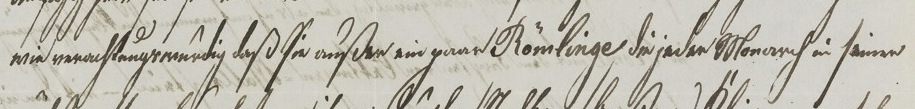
verachtungswürdig daß sie außer ein paar Römlinge die jeder Monarch in seiner
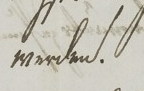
werden.
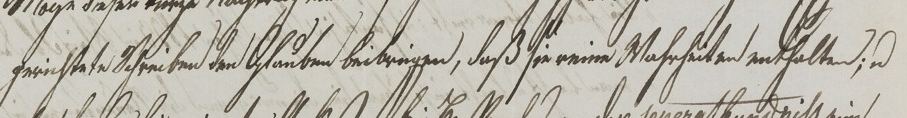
gerichtete Schreiben den Glauben beibringen, daß sie reine
